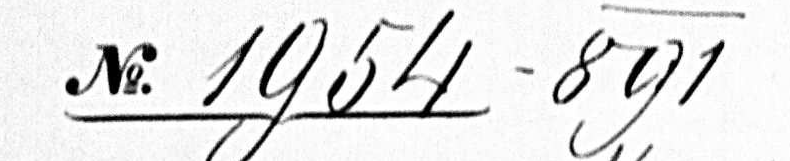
No 1954– 1891
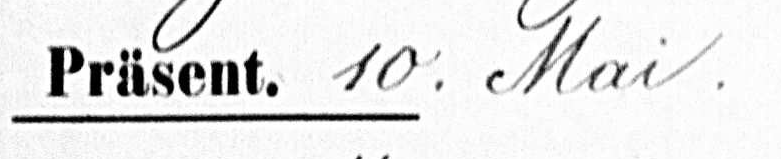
Präsent. – 10. Mai
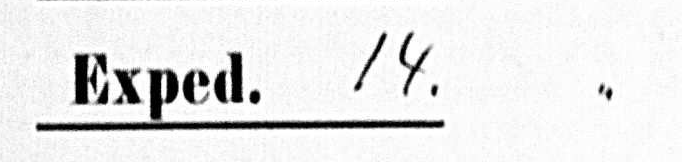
Exped. – 14. „
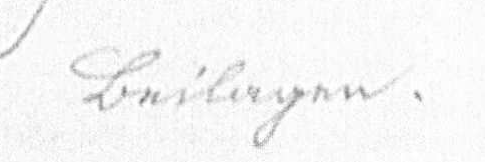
Beilagen
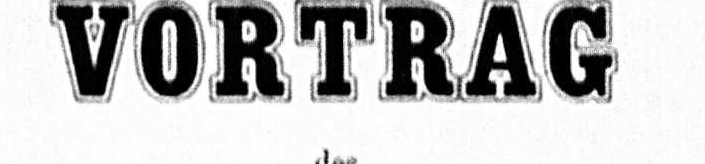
VORTRAG
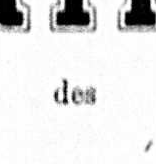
des
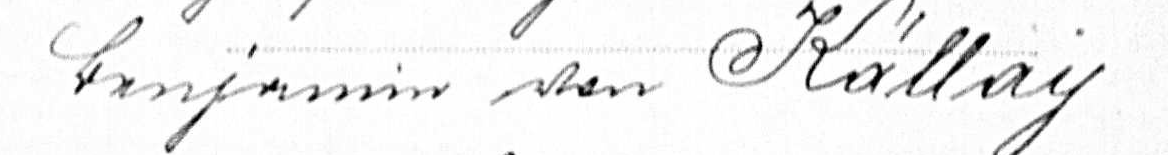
Benjamin von Kállay
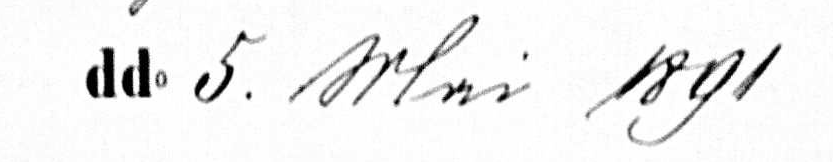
Ddo 5. Mai 1891
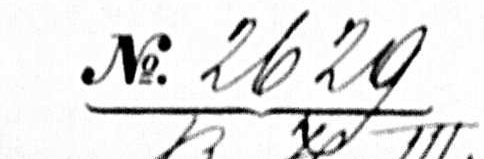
No. 2629
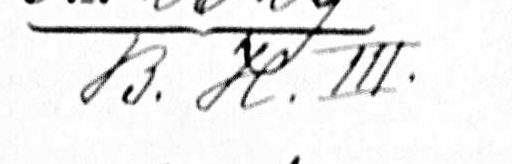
BH III
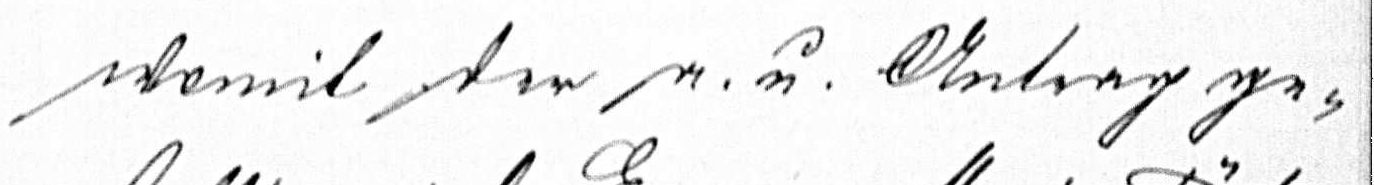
Womit der a.u. Antrag ge¬
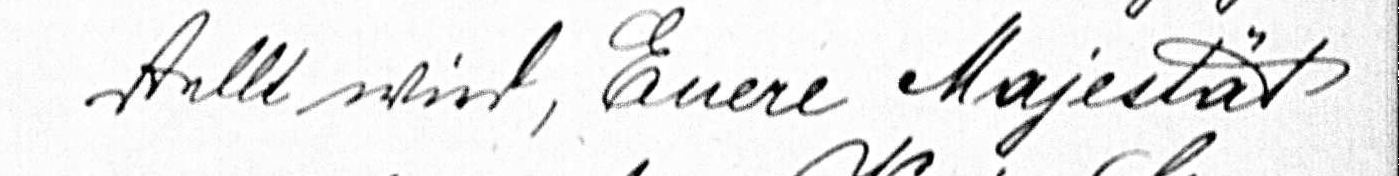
stellt wird, Euere Majestät
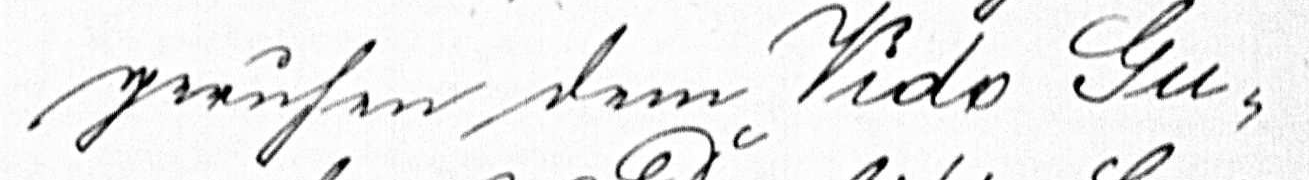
geruhen dem Vido Gu¬
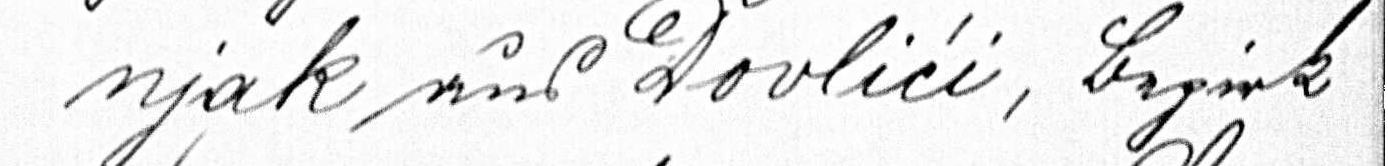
njak aus Ďovlići, Bezirk
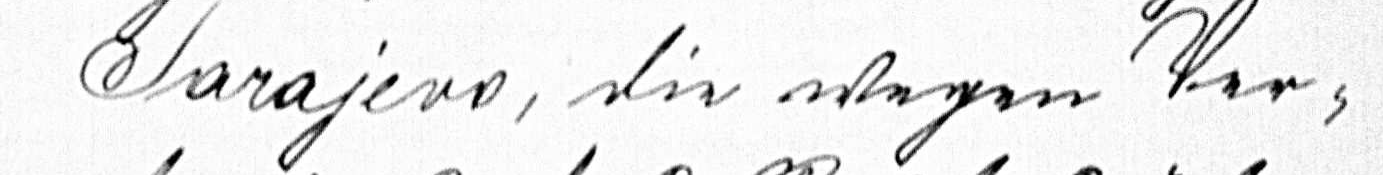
Sarajevo, die wegen Ver¬
